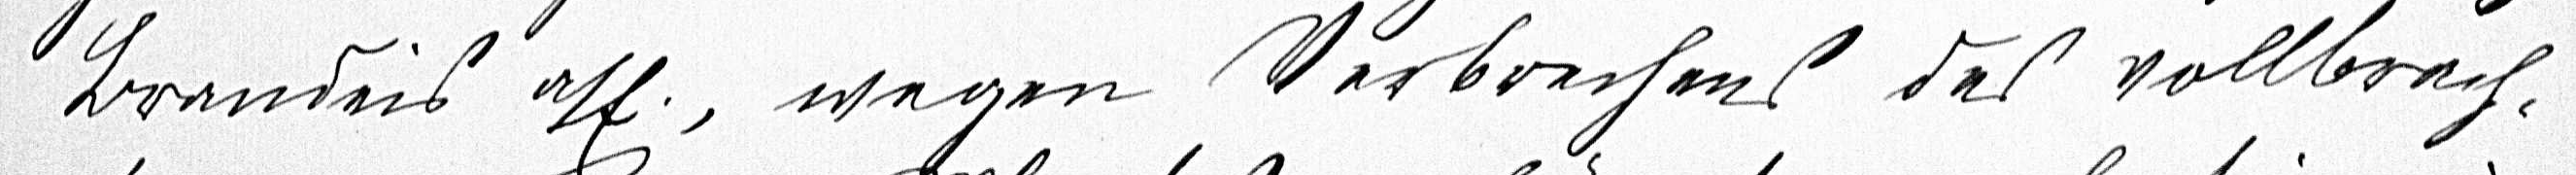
Brandeis a/E, wegen Verbrechens des vollbrach¬
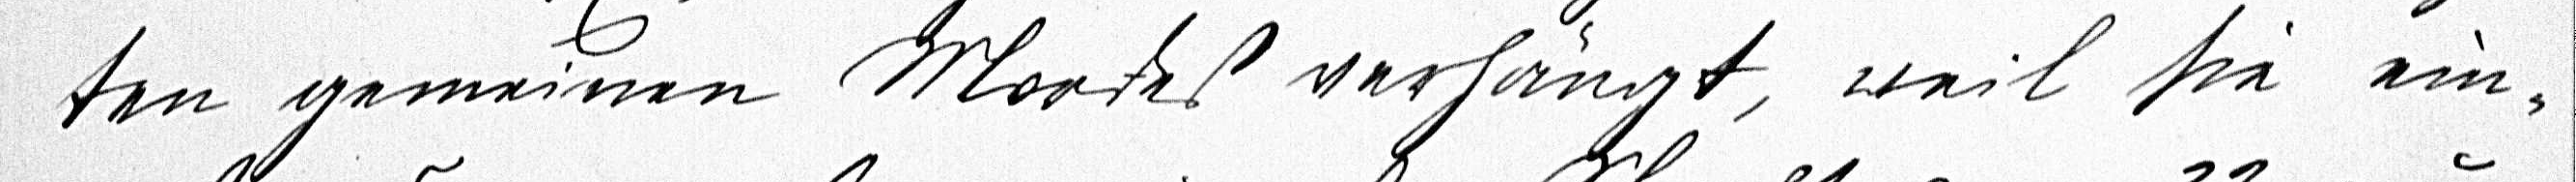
ten gemeinen Mordes verhängt, weil sie ein¬
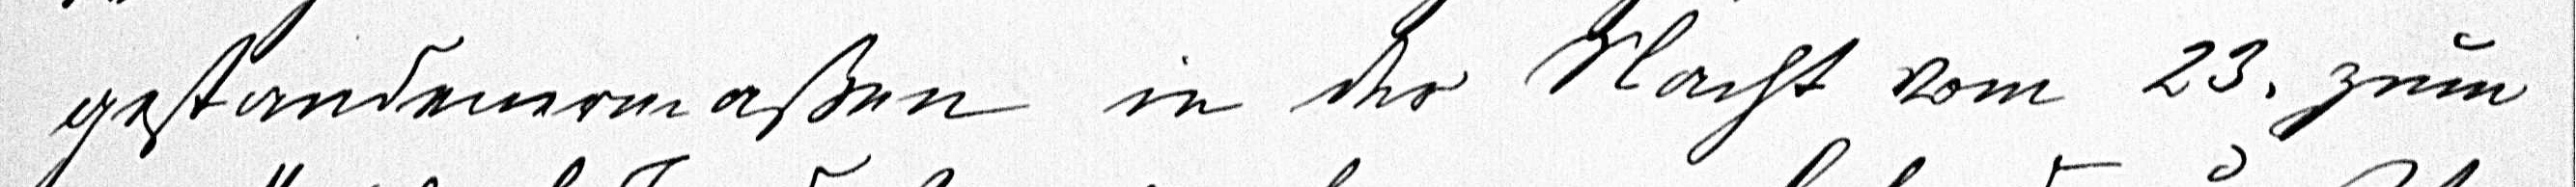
gestandenermaßen in der Nacht vom 23. zum
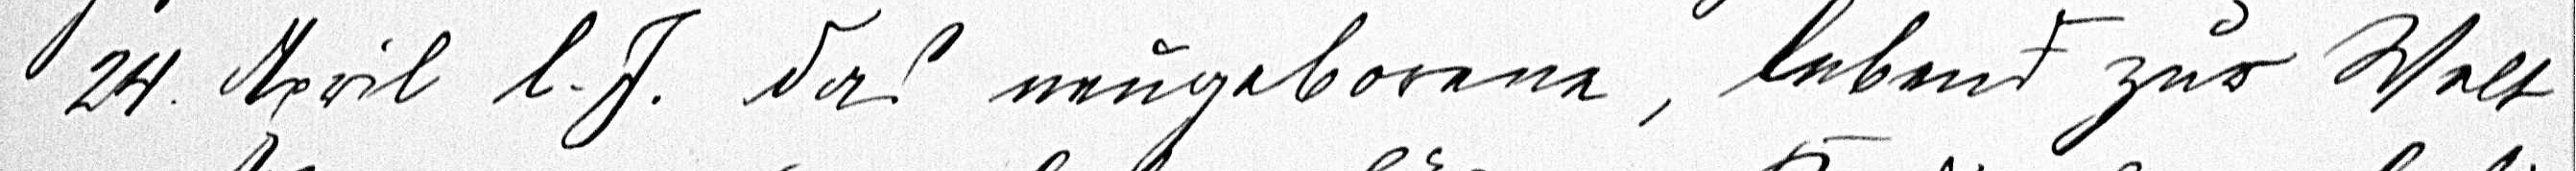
24. April l. J. das neugeborene, lebend zur Welt
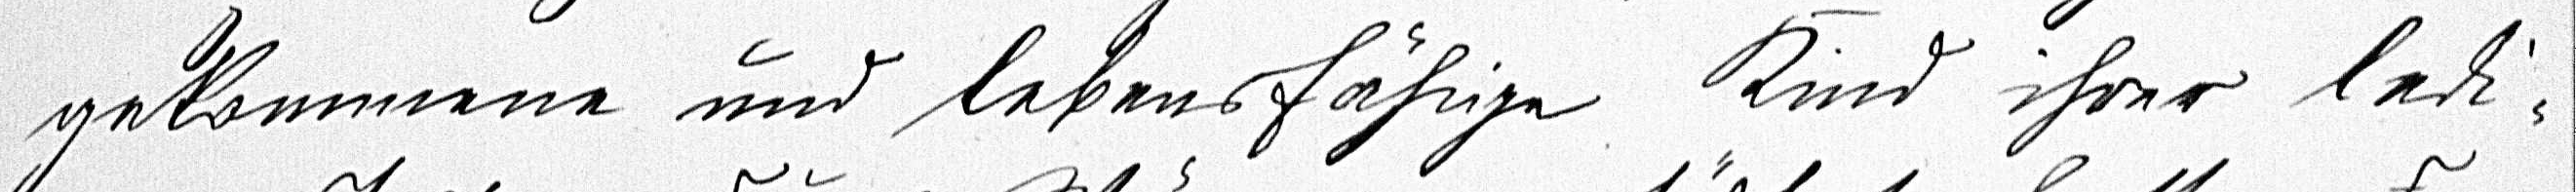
gekommene und lebensfähige Kind ihrer ledi¬
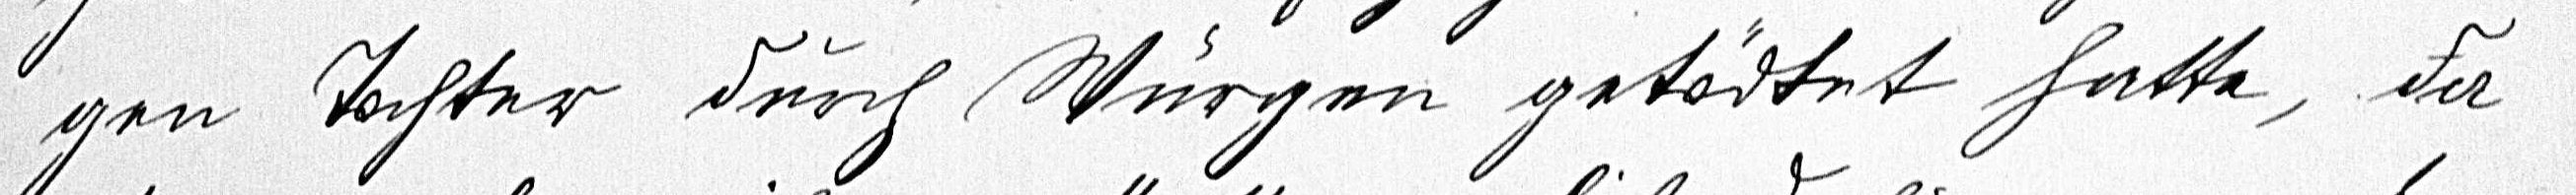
gen Tochter durch Würgen getödtet hatte, da
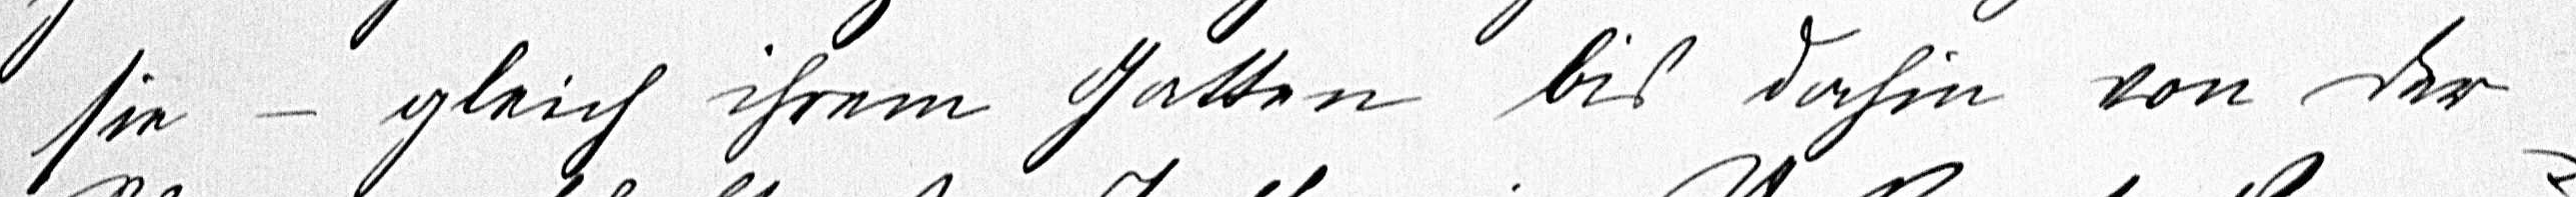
sie – gleich ihrem Gatten bis dahin von der
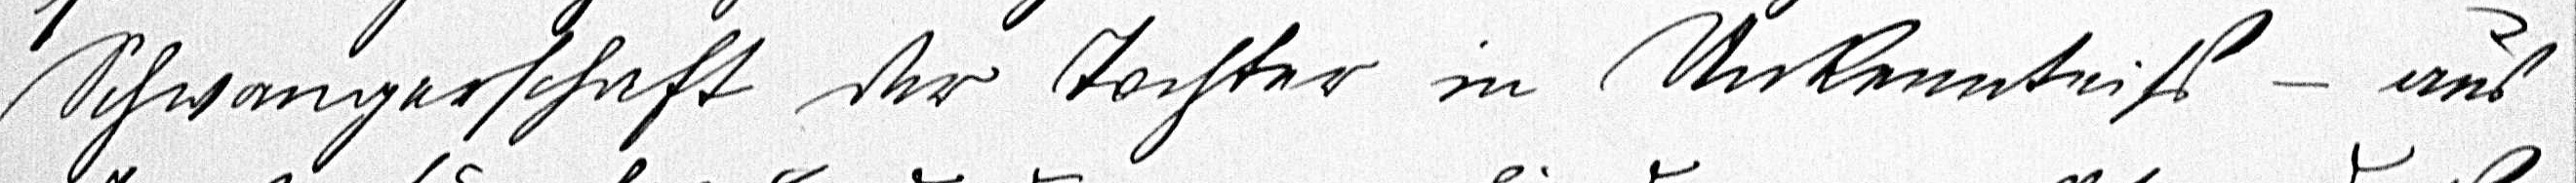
Schwangerschaft der Tochter in Unkenntniß – aus
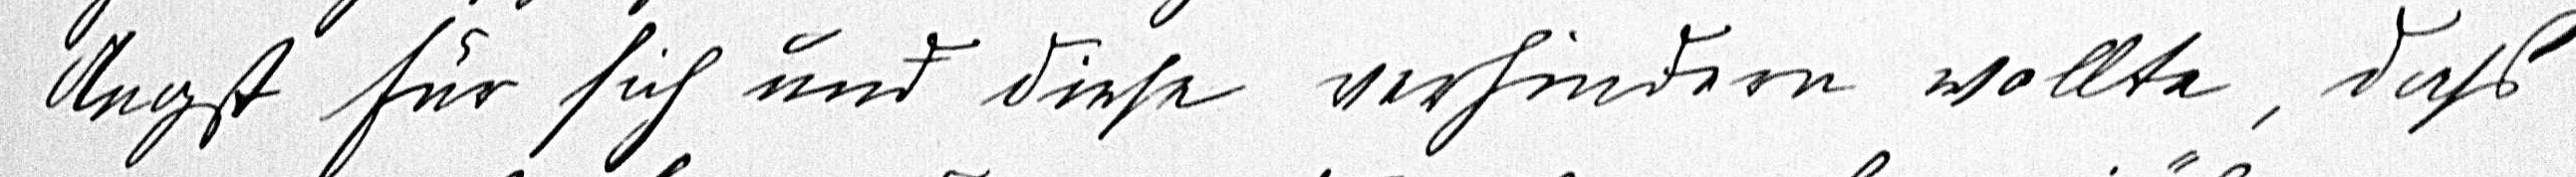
Angst für sich und diese verhindern wollte, daß
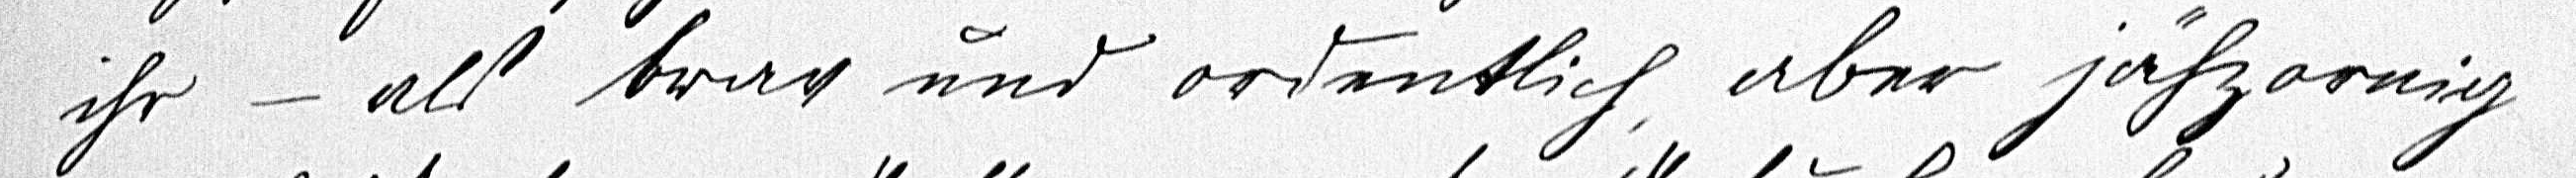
ihr – als brav und ordentlich, aber jähzornig
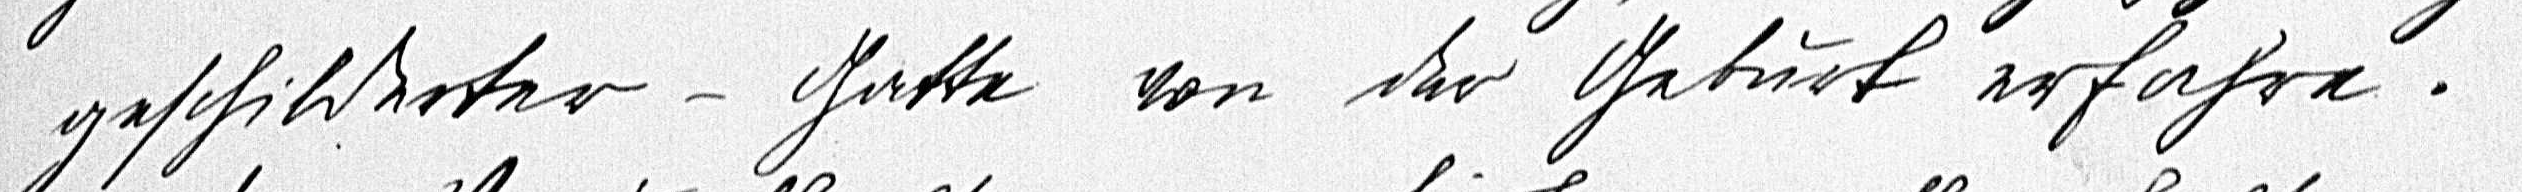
geschilderter – Gatte von der Geburt erfahre.
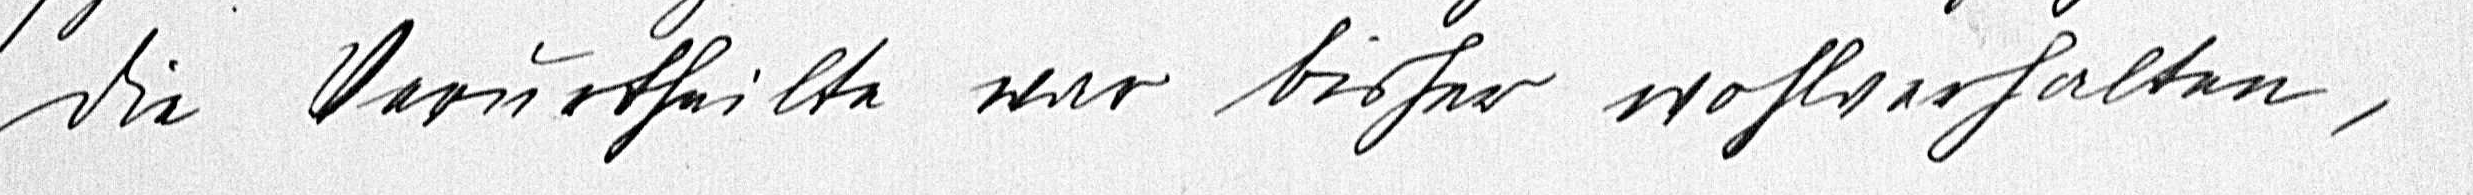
Die Verurtheilte war bisher wohlverhalten,
